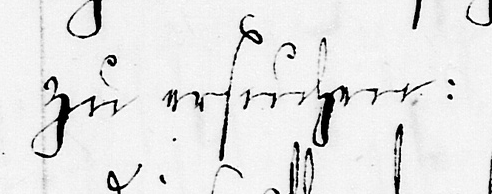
zu ersuchen:
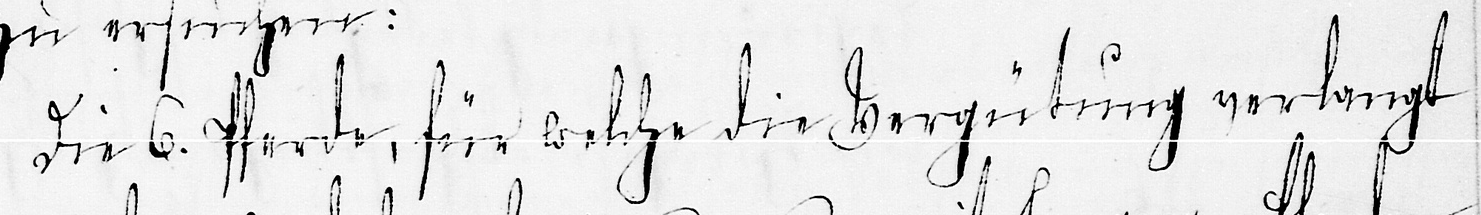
Die 6. Pferde, für welche die Vergütung verlangt
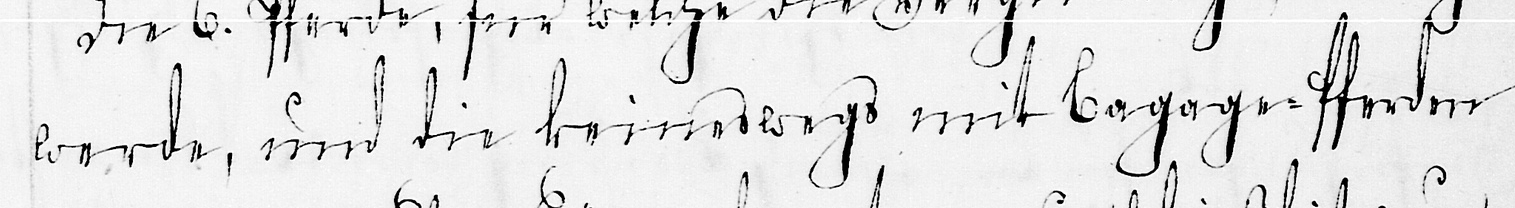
werde, und die keineswegs mit Bagage-Pferden
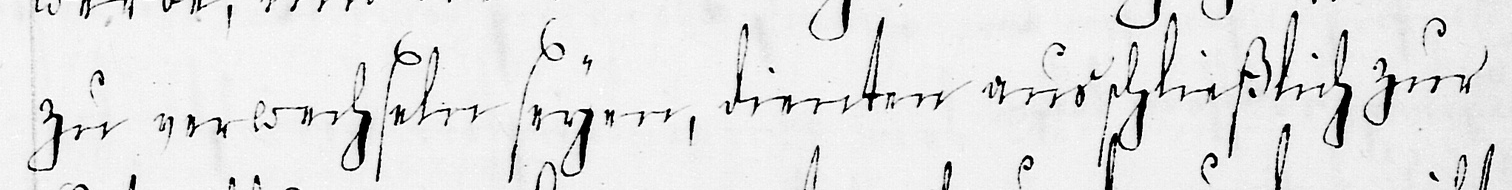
zu verwechseln seyen, dienten ausschließlich zur
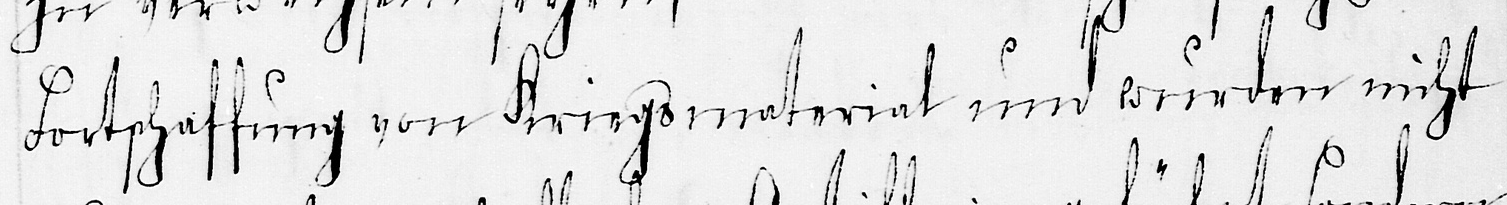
Fortschaffung von Kriegsmaterial und wurden nicht
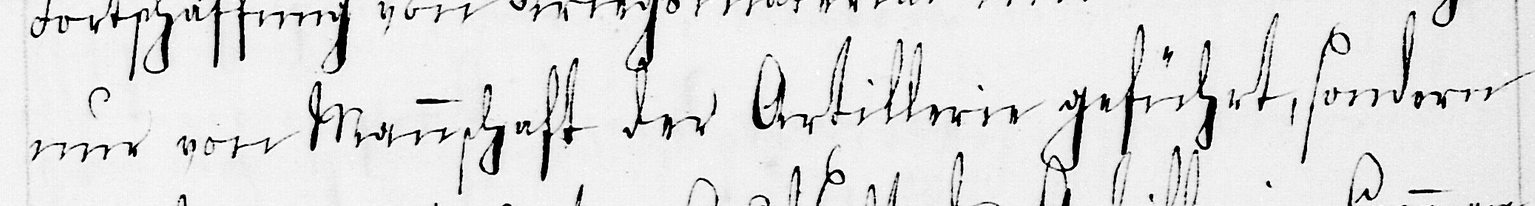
nur von Mannschaft der Artillerie geführt, sondern
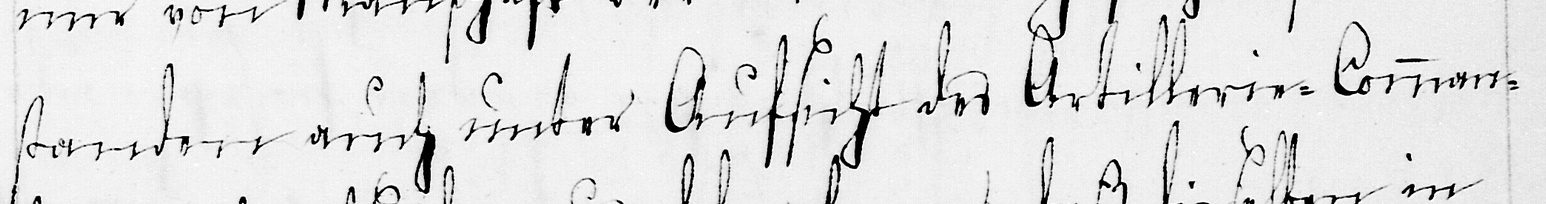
standen auch unter Aufsicht des Artillerie-Comman¬
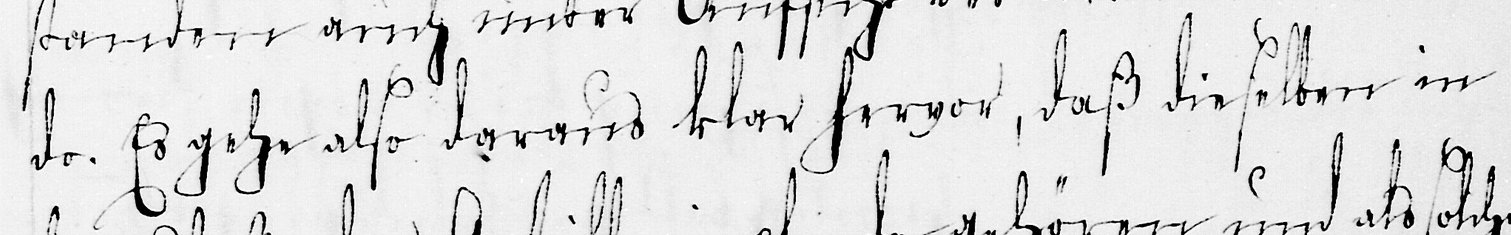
do. Es gehe also daraus klar hervor, daß dieselben in
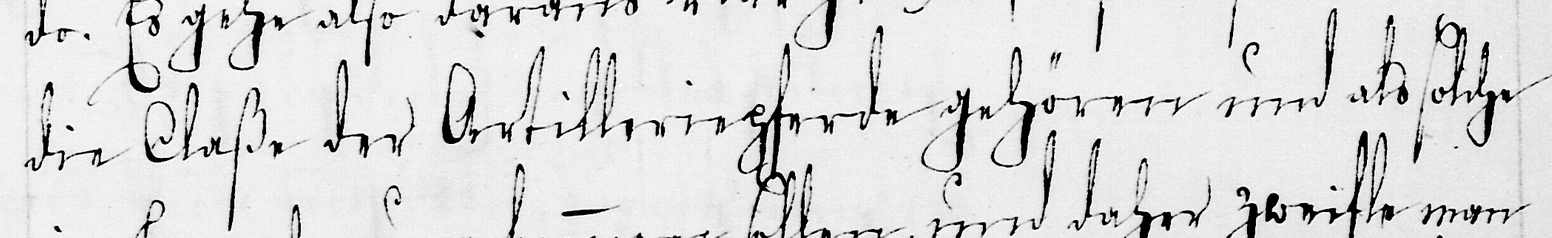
die Claße der Artilleriepferde gehören und als solche
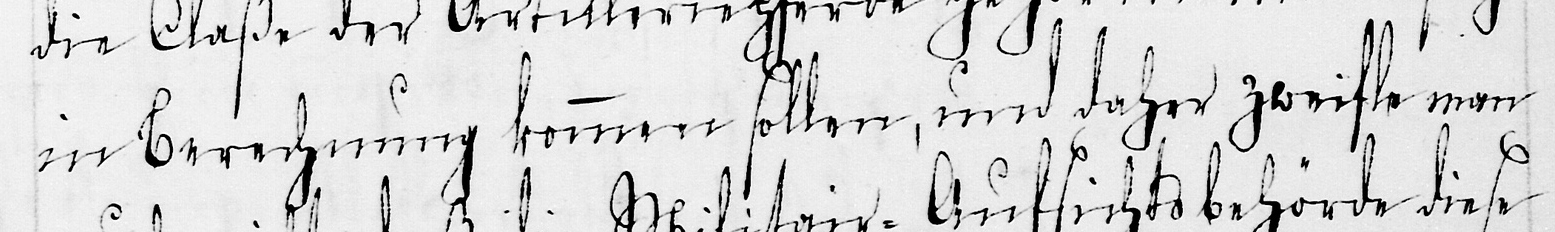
in Berechnung kommen sollen, und daher zweifle man
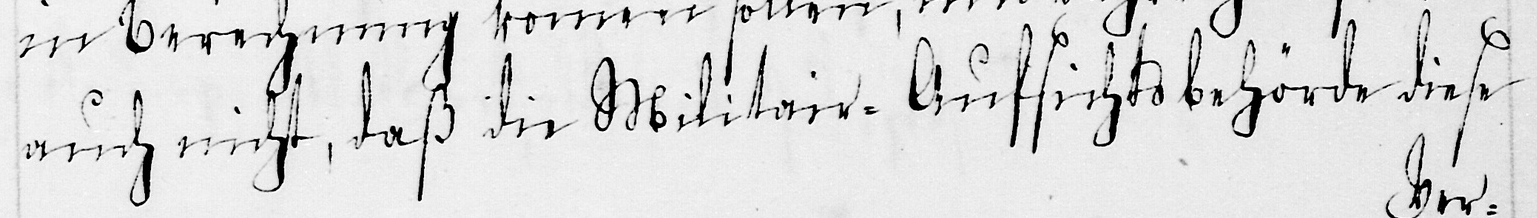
auch nicht, daß die Militair-Aufsichtsbehörde diese
